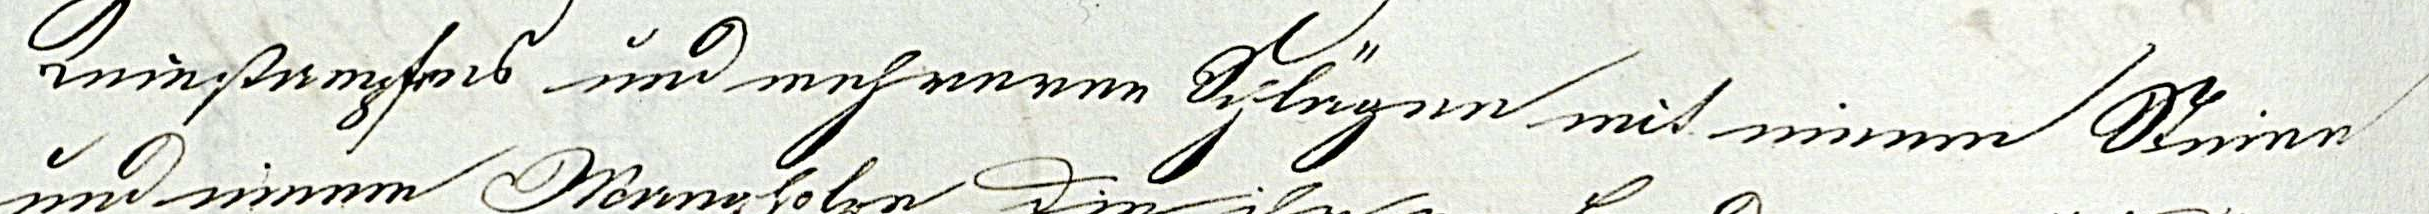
Kniestampfes und mehreren Schlägen mit einem Steine
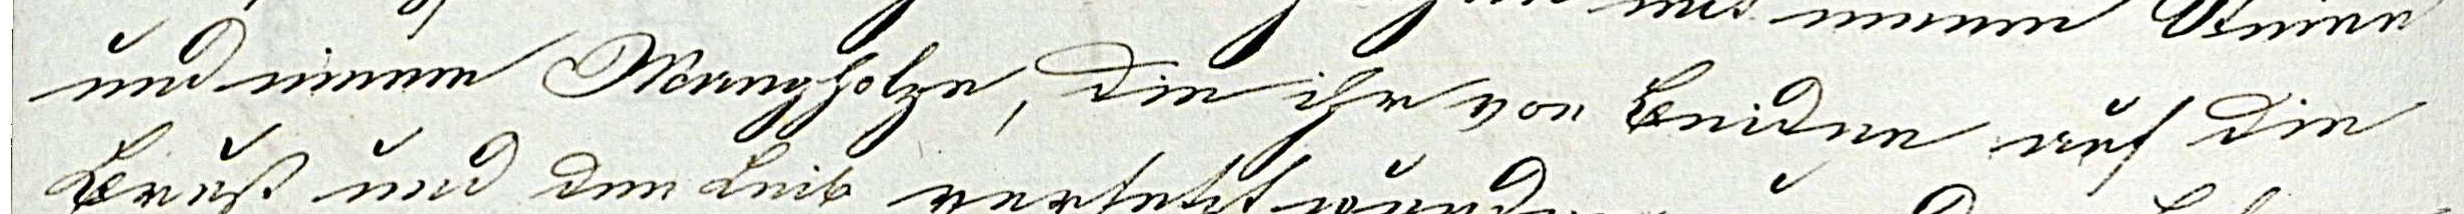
und einem Worngholze, die ihr von beiden auf die
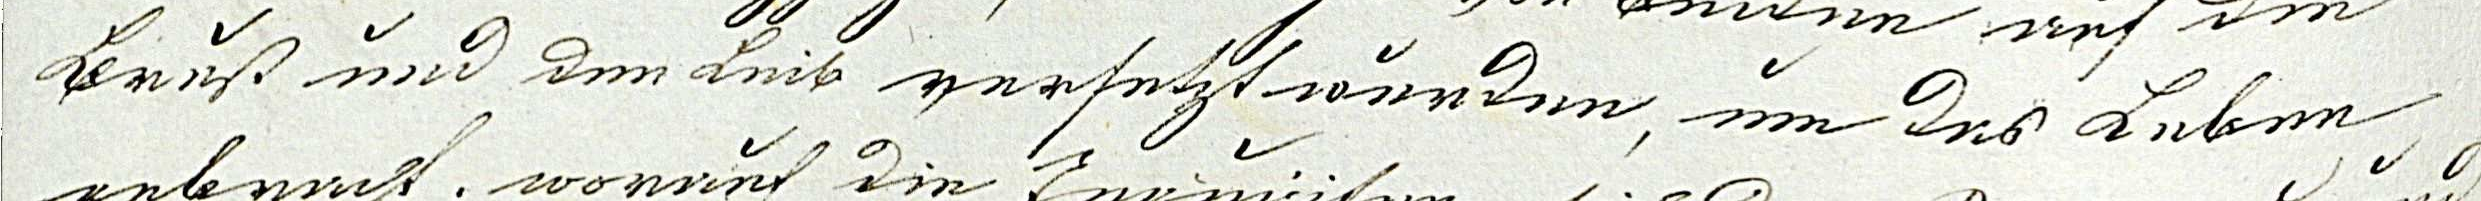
Brust und dem Leib versetzt wurden, um das Leben
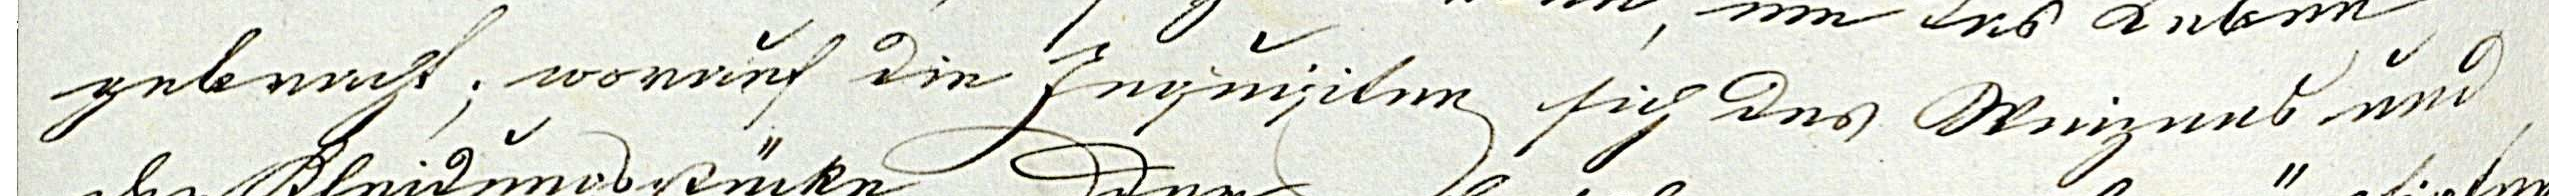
gebracht, worauf die Inquisiten sich des Weizens und
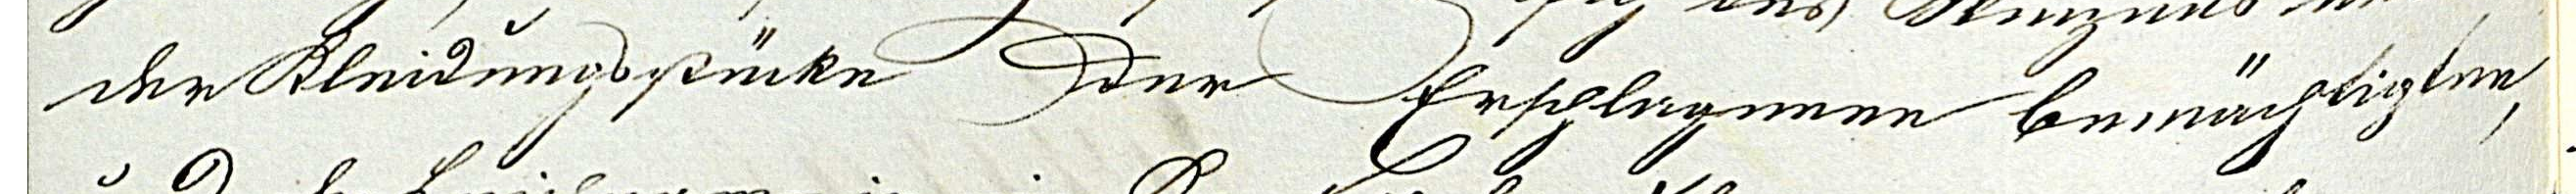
der Kleidungsstücke der Erschlagenen bemächtigten,
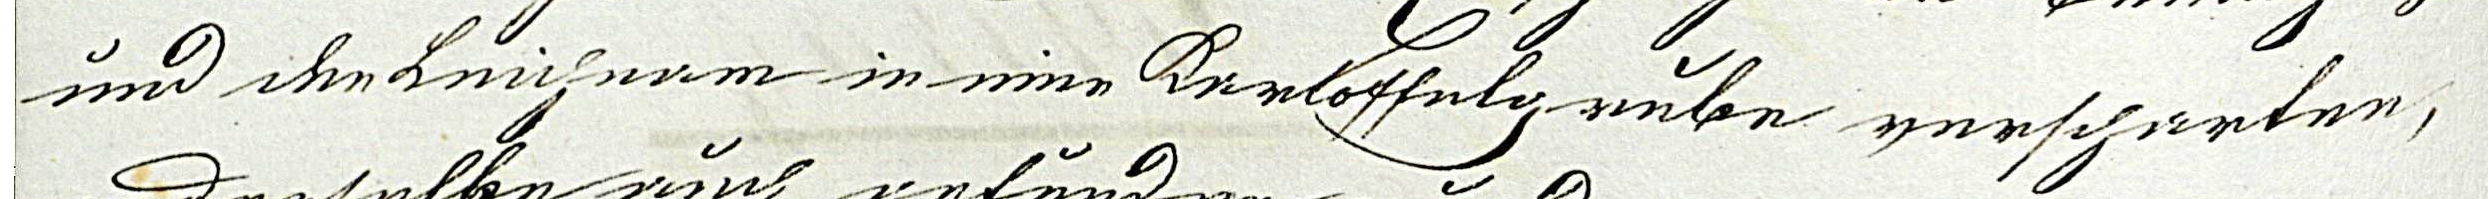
und den Leichnam in eine Kartoffelgrube verscharten,
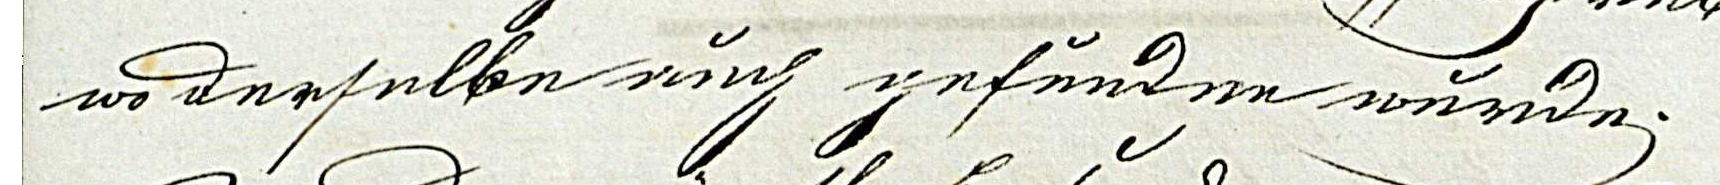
wo derselbe auch gefunden wurde.
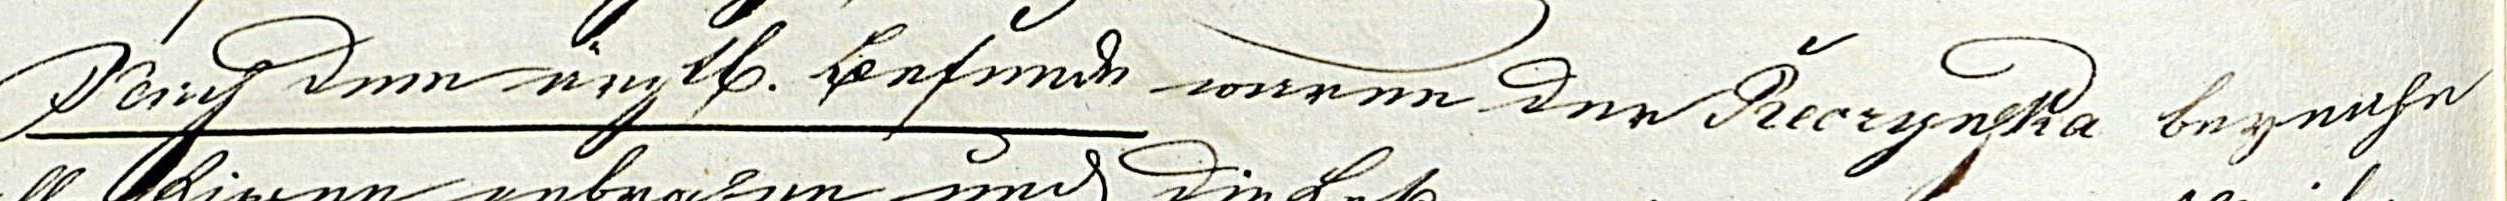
Durch dem ärztl. Befunde waren der Řeczynska beynahe
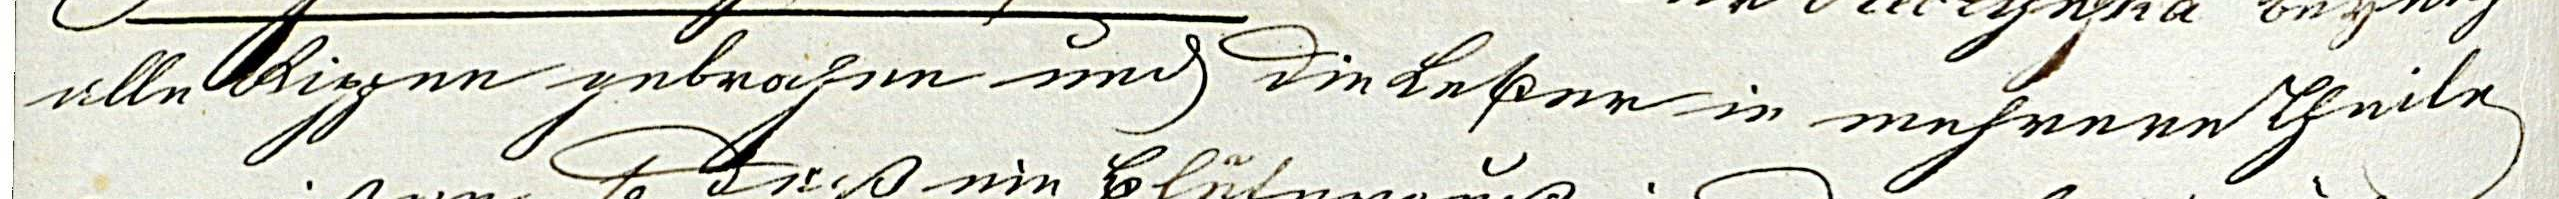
alle Rippe gebrochen und die Leber in mehrere Theile
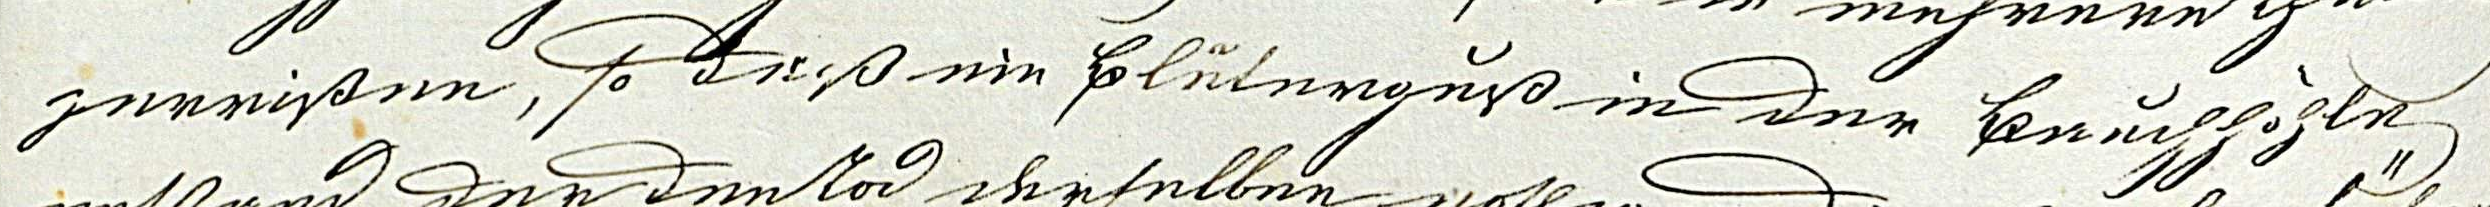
zerrisen, so daß ein blüterguß in der Bruchhöhle
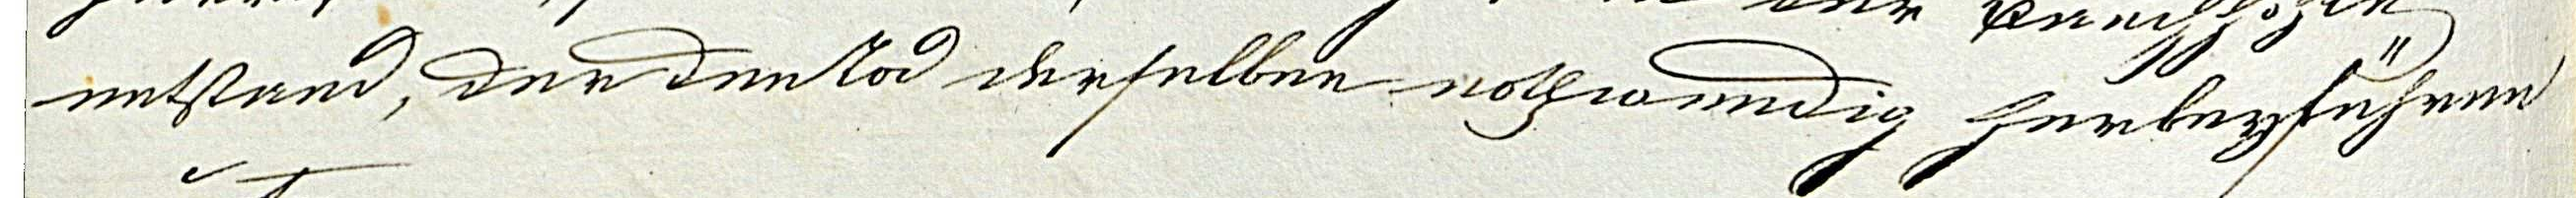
entstand, der den Tod derselben nothwendig herbeyführten
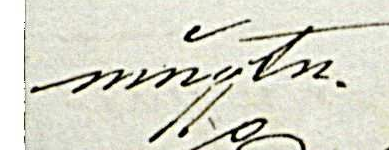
musste.
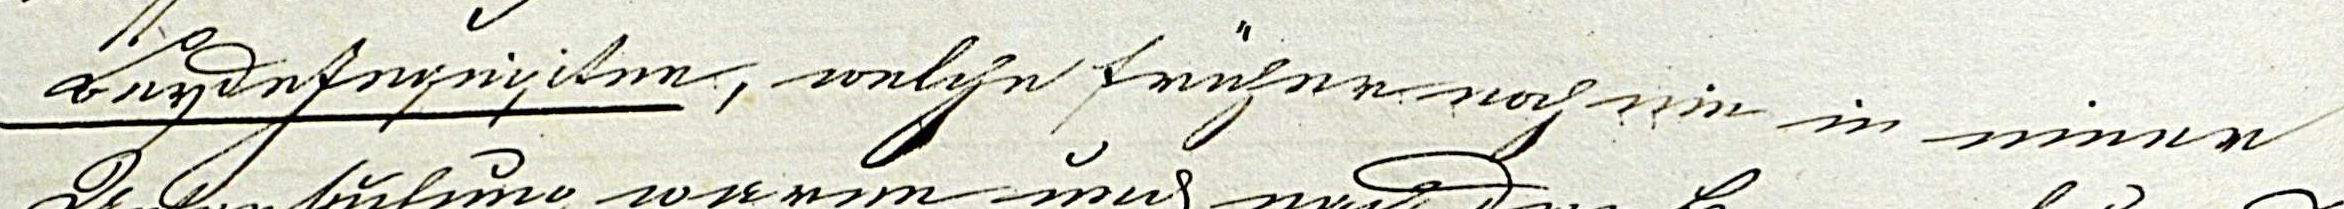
Beyde Inquisiten, welche früher noch ein in einer
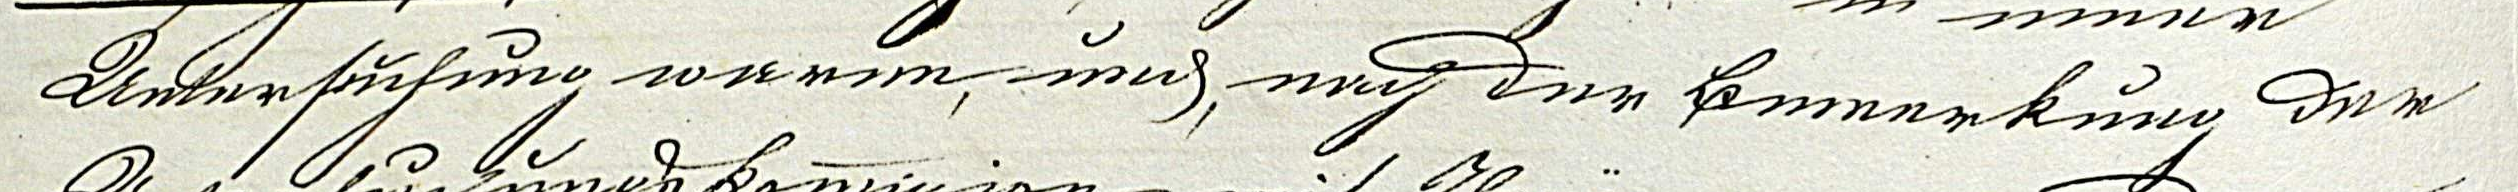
Untersuchung waren, und, nach der Bemerkung der
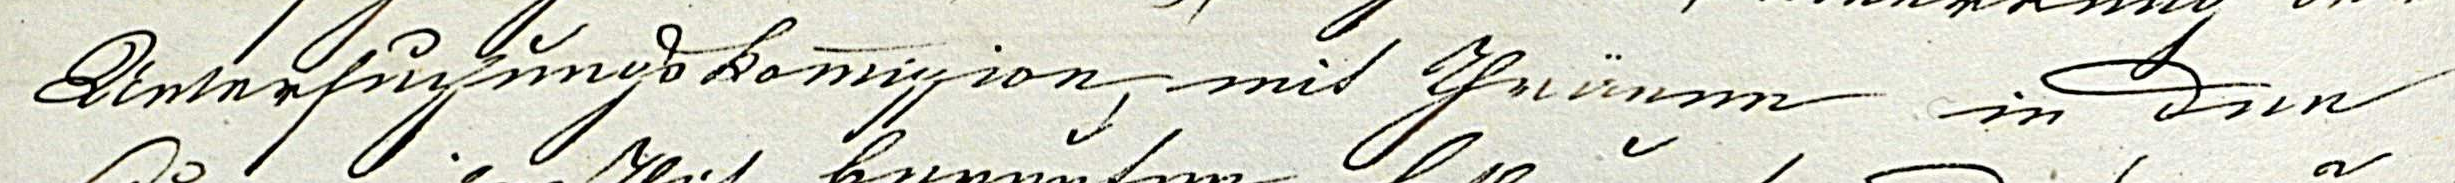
Untersuchungskommission mit Thränen in den
